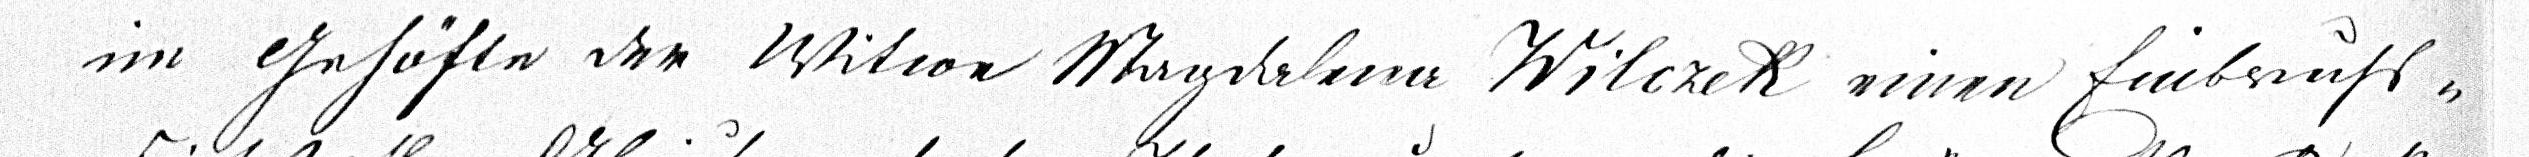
im Gehöfte der Witwe Magdalena Wilczek einen Einbruf¬
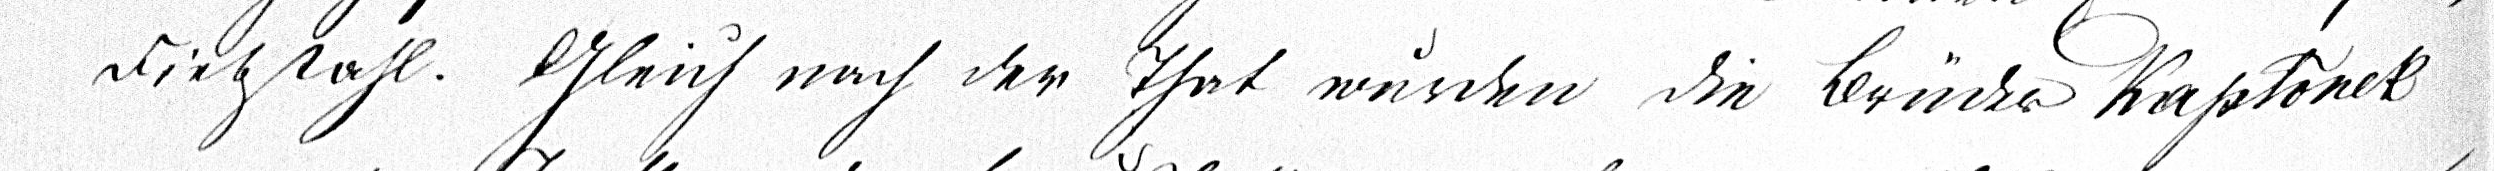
diebstahl. Gleich nach der That wurden die Brüder Kaptonek
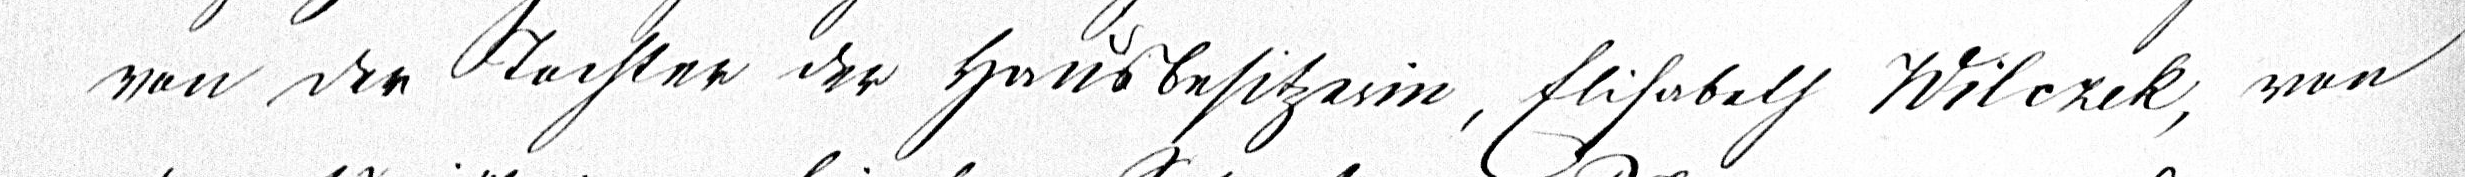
von der Tochter der Hausbesitzerin, Elisabeth Wilczek, von
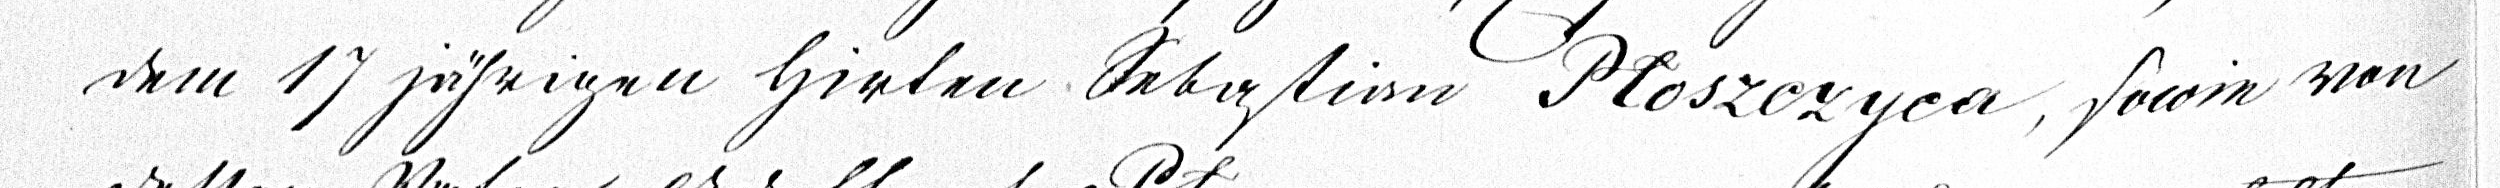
dem 17 jährigen Hirten Sebastian Płoszczyca, sowie von
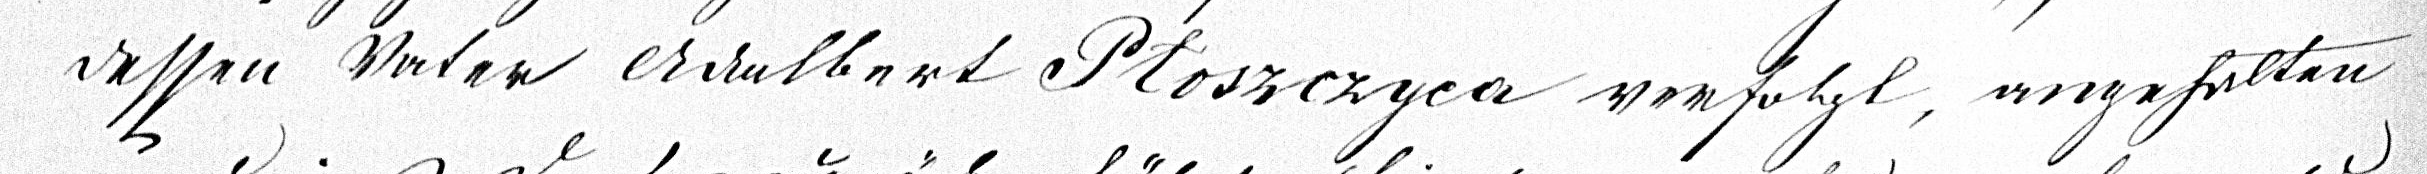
dessen Vater Adelbert Płoszczyca verfolgt, angehalten
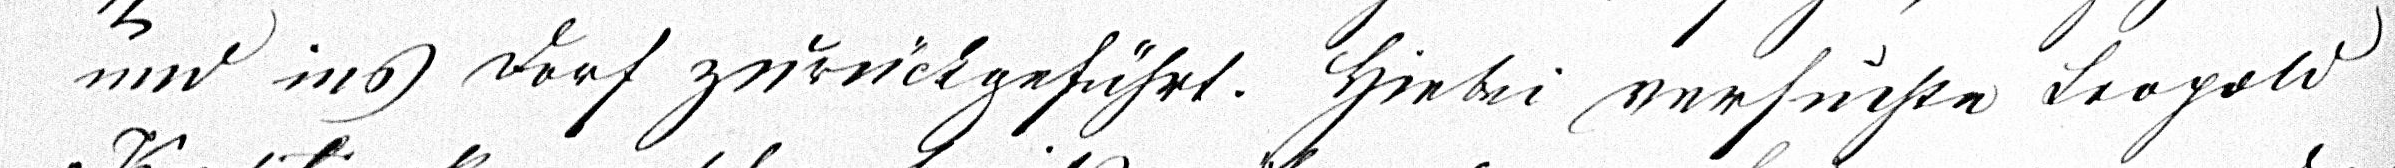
und ins Dorf zurückgeführt. Hiebei versuchte Leopold
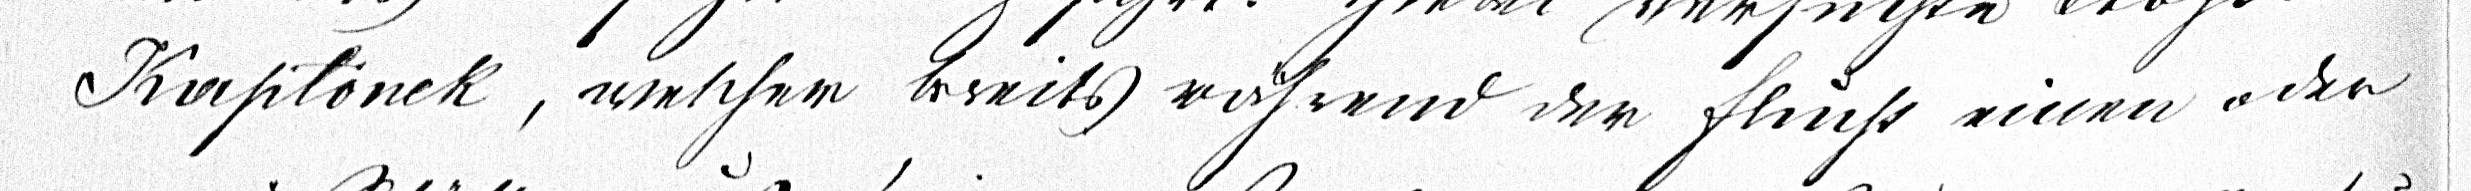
Kaptonek, welcher bereits während der Flucht einen oder
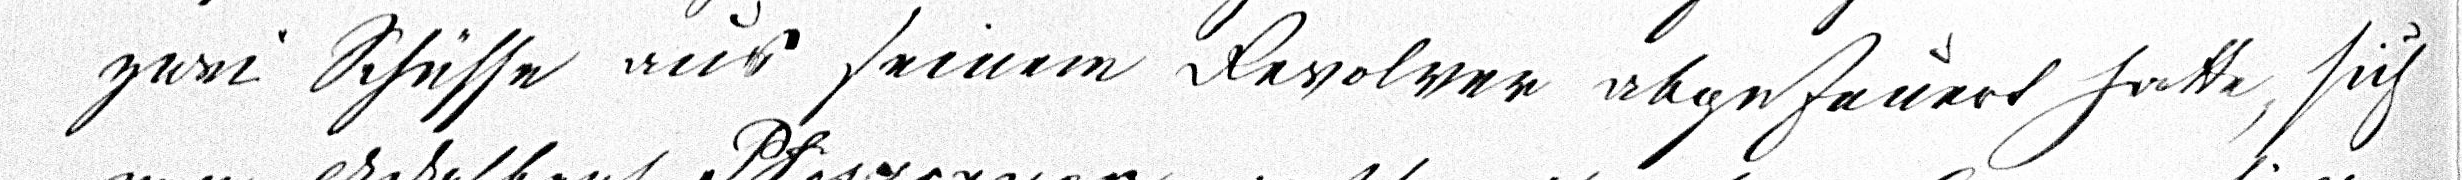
zwei Schüsse aus seinem Devolwer abgefeuert hatte, sich
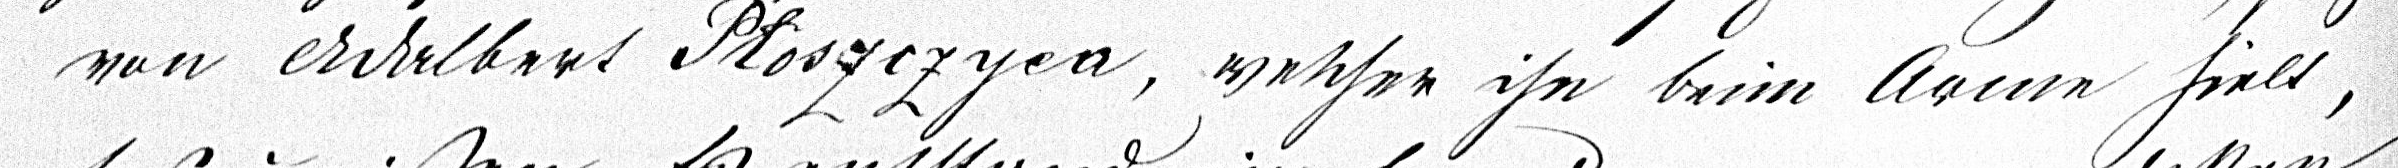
von Adalbert Płoszczyca, welcher ihn beim Arme hielt,
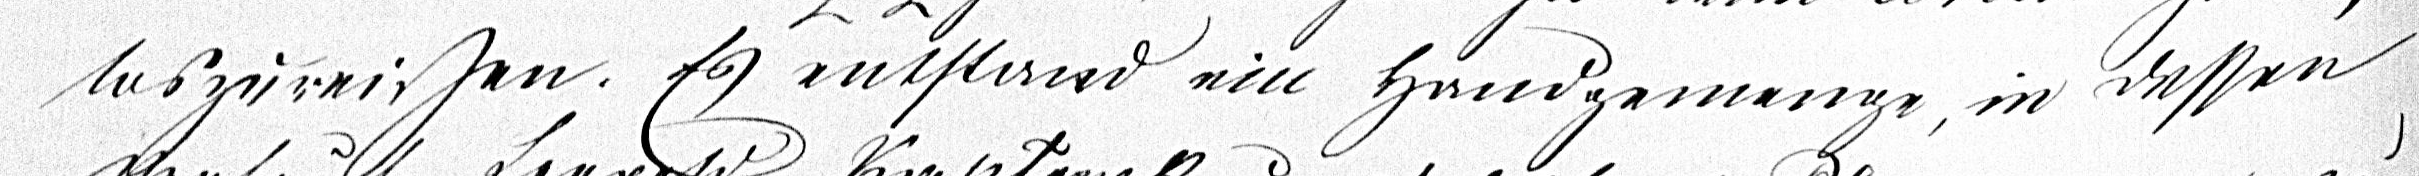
loszureißen. Es entstand ein Handgemenge, in dessen
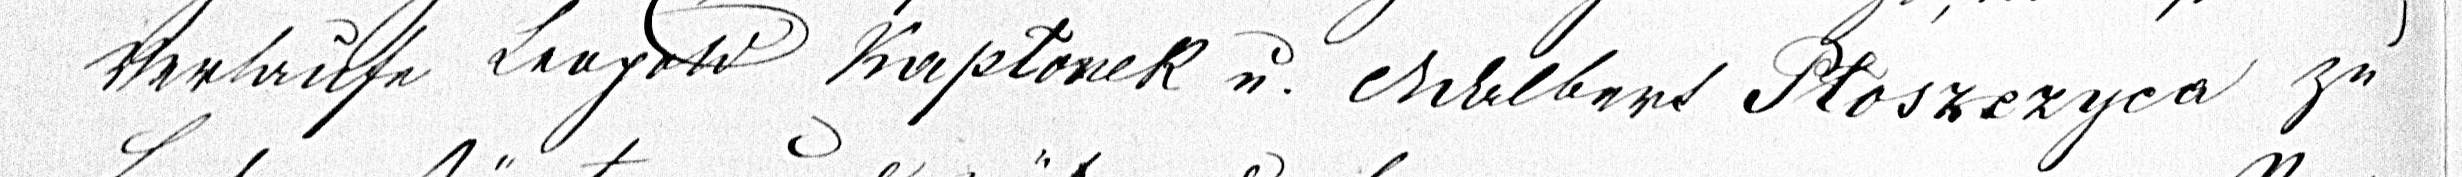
verlaufe Leopold Kaptonek u. Adalbert Płoszezyca zu
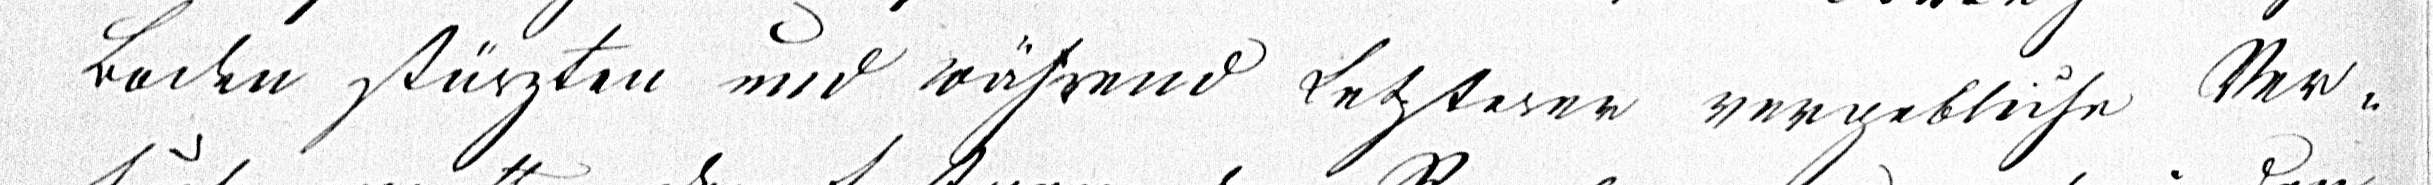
Boden, stürzten und während Letzterer vergebliche Ver¬
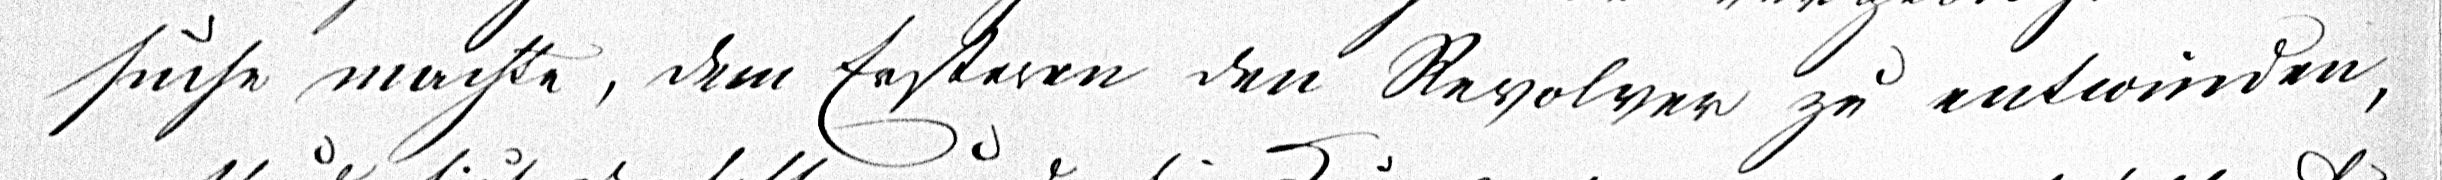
suche machte, dem Ersteren den Revolver zu entwinden,
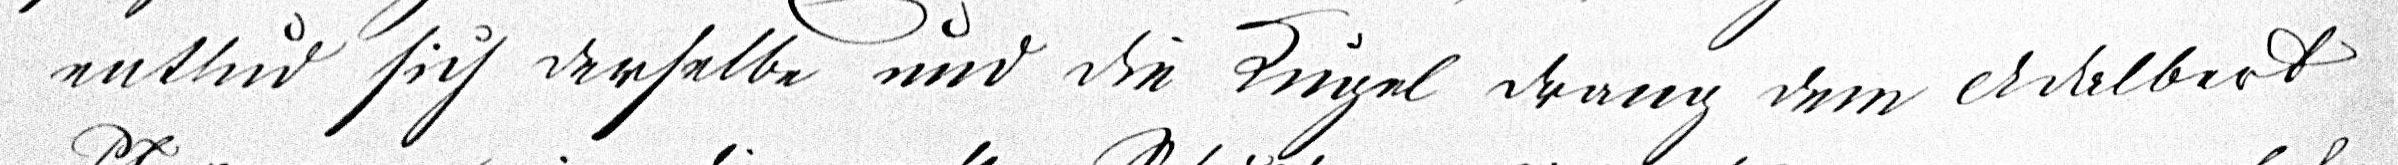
entlud sich derselbe und die Kugel drang dem Adelbert
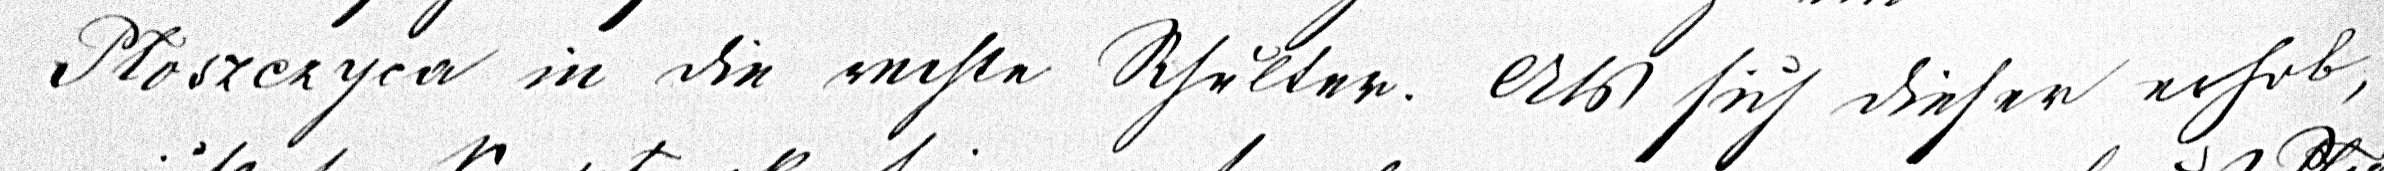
Ploszezyca in die rechte Rhulter. Als sich dieser erhob,
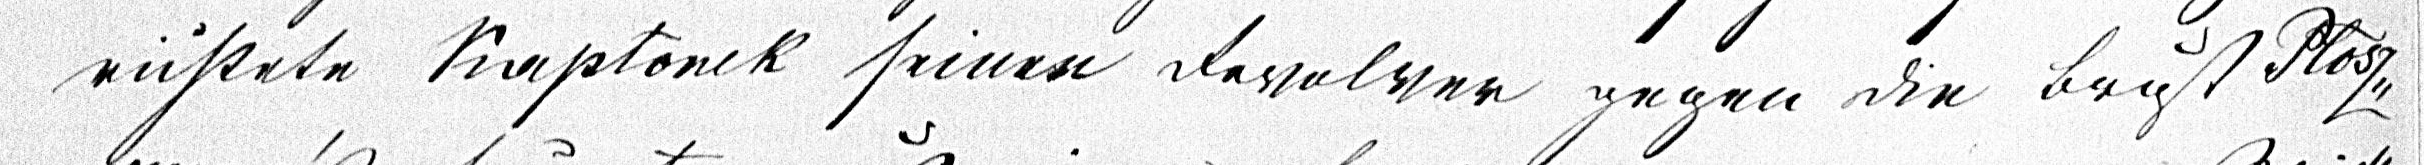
eichtete Kaptonek seinen Devolver gegen die Brust Płos¬
